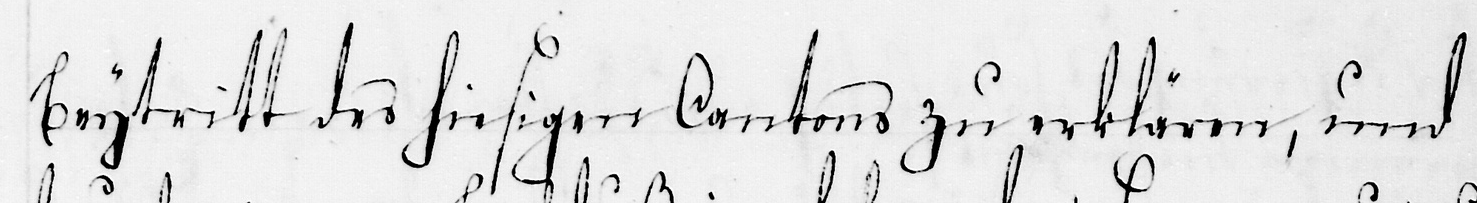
Beytritt des hiesigen Cantons zu erklären, und
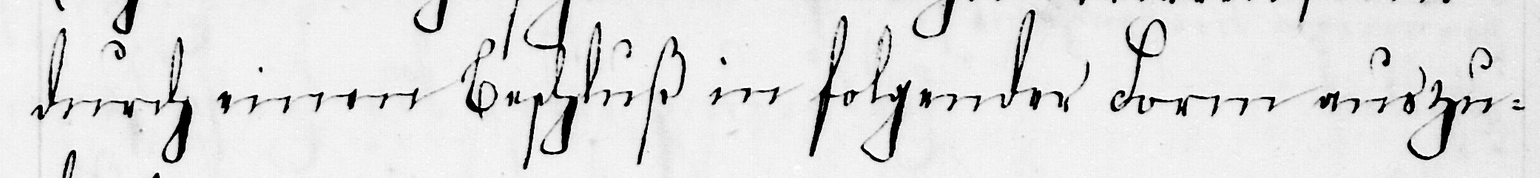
durch einen Beschluß in folgender Form auszu¬
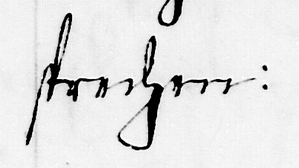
sprechen:
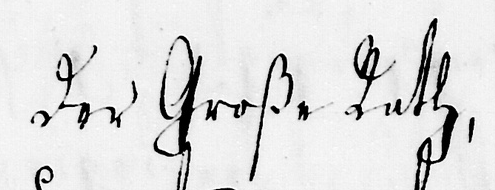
Der Große Rath,
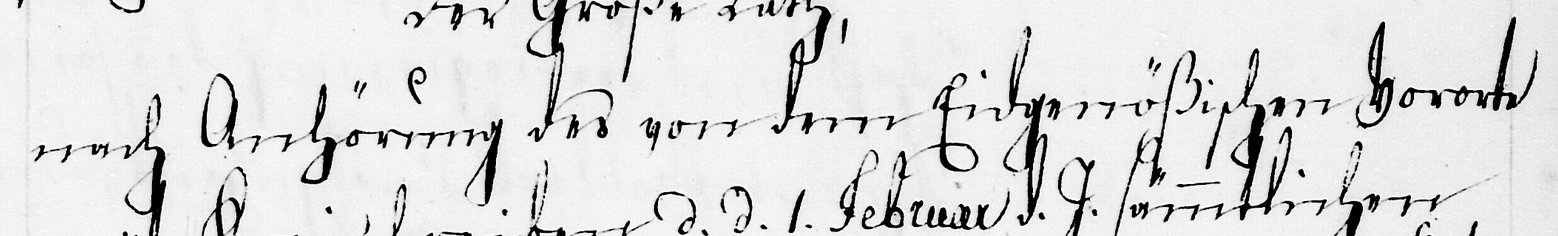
nach Anhörung des von dem Eidgenößischen Vororte
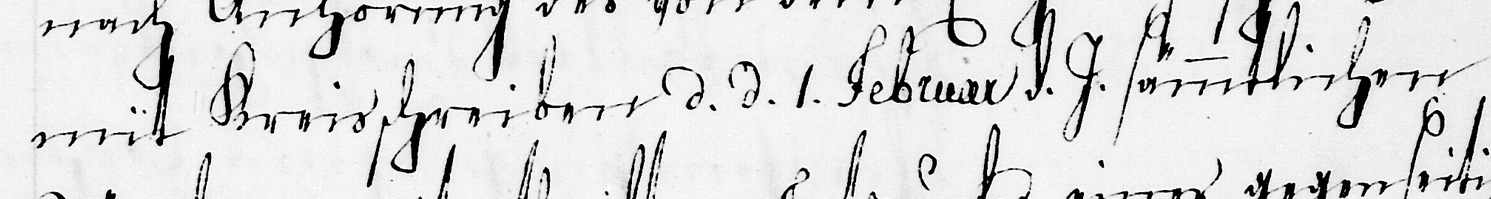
mit Kreisschreiben d. d. 1. Februar d. J. sämmtlichen
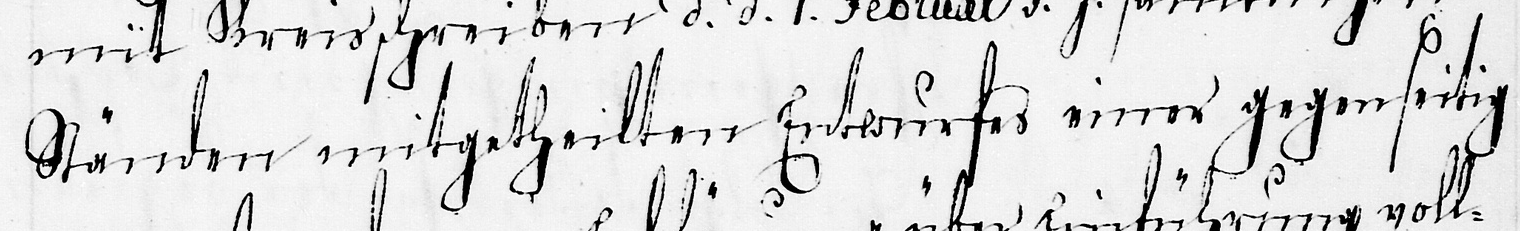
Ständen mitgetheilten Entwurfes einer gegenseitig
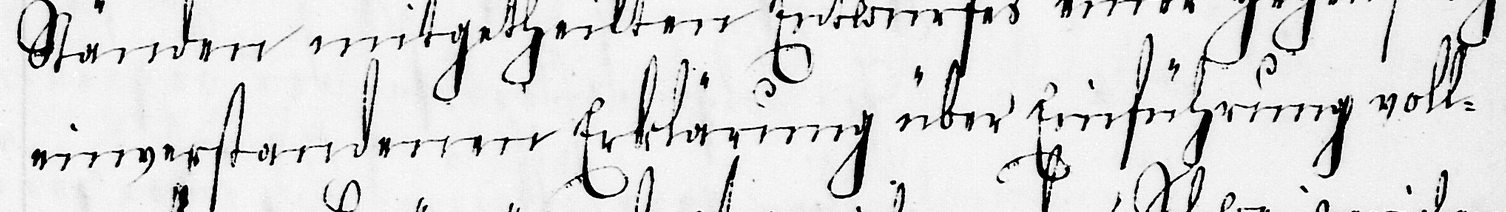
einverstandenen Erklärung über Einführung voll¬
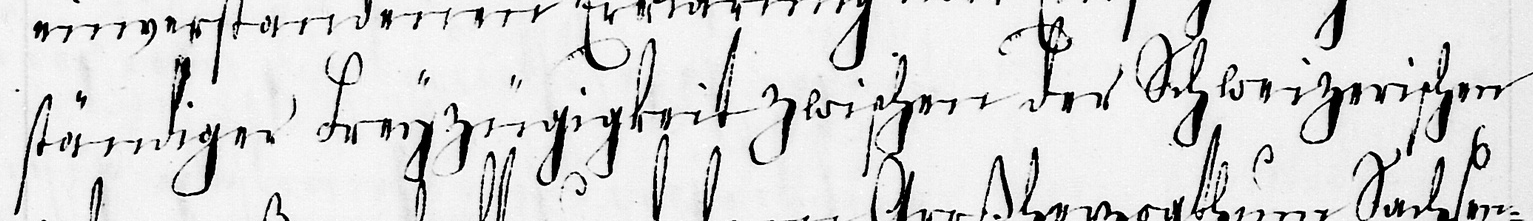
ständiger Freyzügigkeit zwischen der Schweizerischen
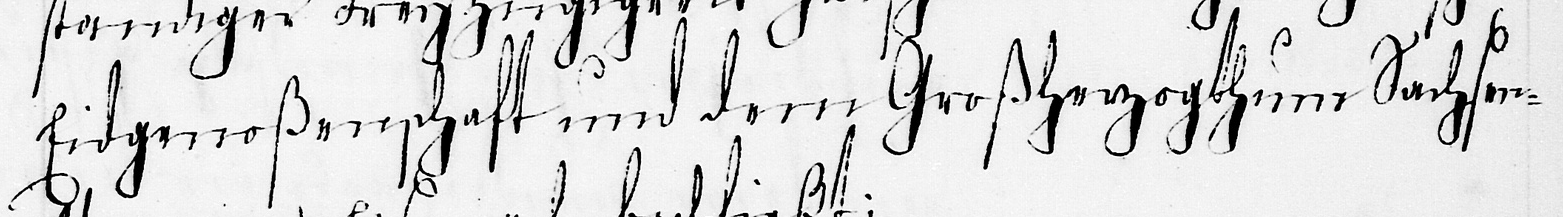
Eidgenoßenschaft und dem Großherzogthum Sachse¬
